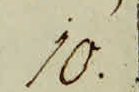10.
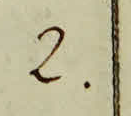2.
